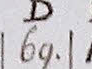69.
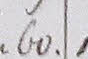60.
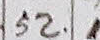52.
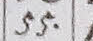55.
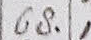68.
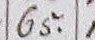65.
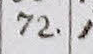72.
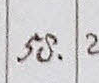58.
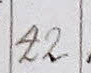42
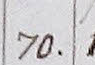70.
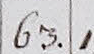63.
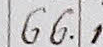66.
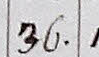36.
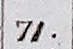71
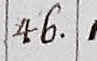46.
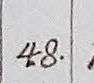48.
